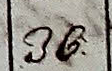36.
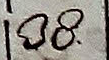38.
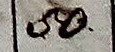50.
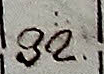32.
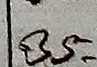35
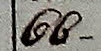66
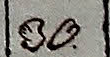30.
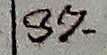37
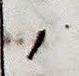1
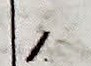1.
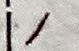1
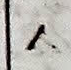1
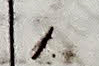1.
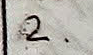2.
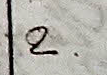2.
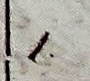1.
